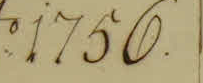1756.
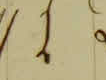1
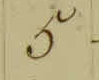5
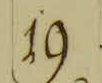19
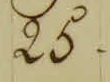25
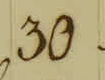30
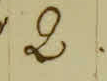2
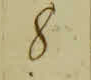8
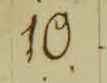10
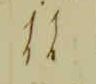11
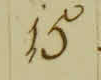15
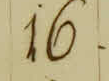16
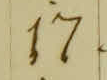17
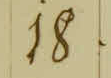18
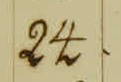24
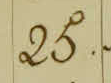25
